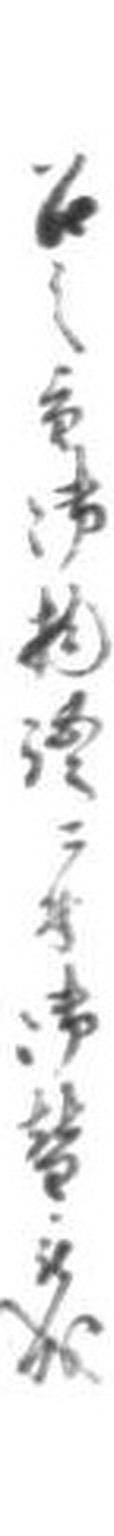召之旨御物語ニ付御替被成

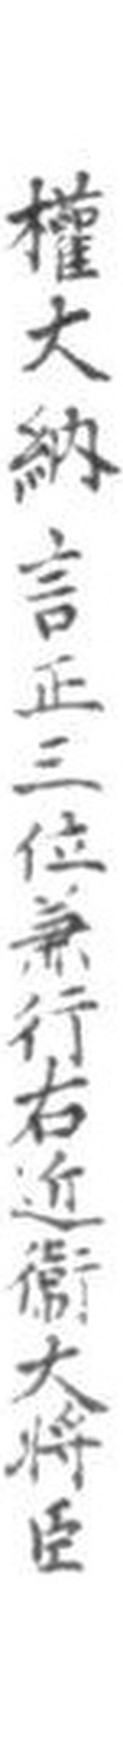権大納言正三位兼行右近衛大将臣房凞
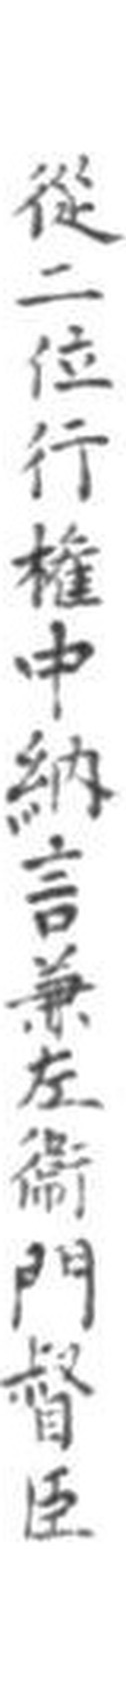従二位行権中納言兼左衛門督臣
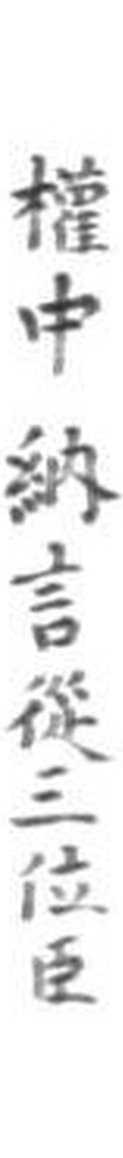権中納言従三位臣益光
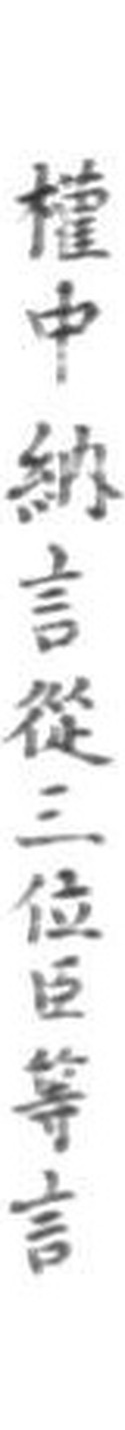権中納言従三位臣等言
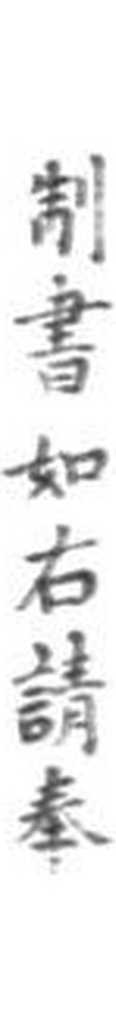制書如右請奉
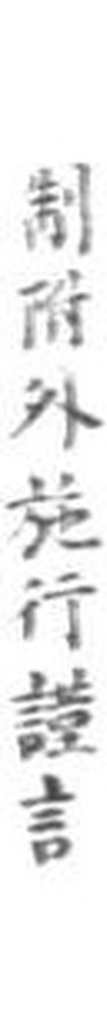制附外施行謹言
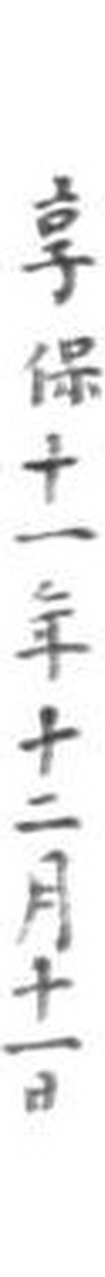享保十一年十二月十一日
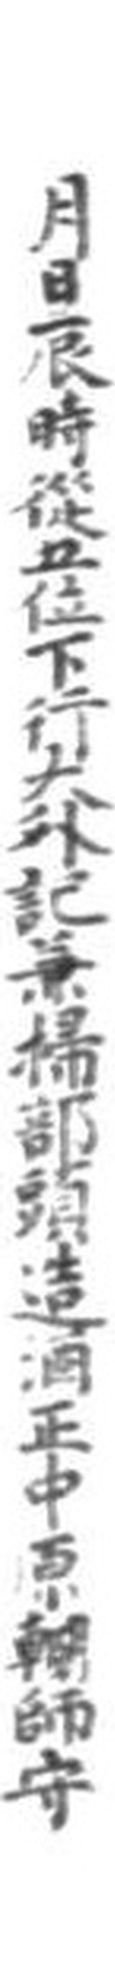月日辰時従五位下行大外記兼掃部頭造酒正中原朝臣師守

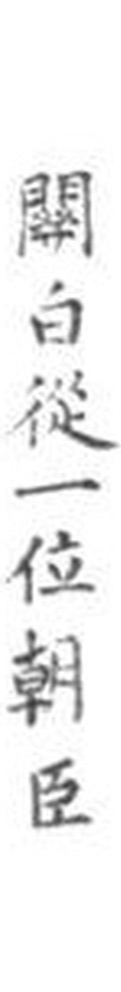関白十一位朝臣
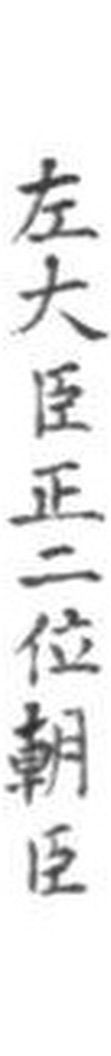左大臣正二位朝臣
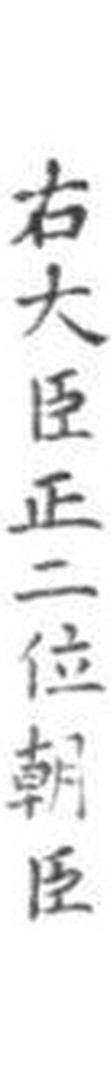右大臣正二位朝臣
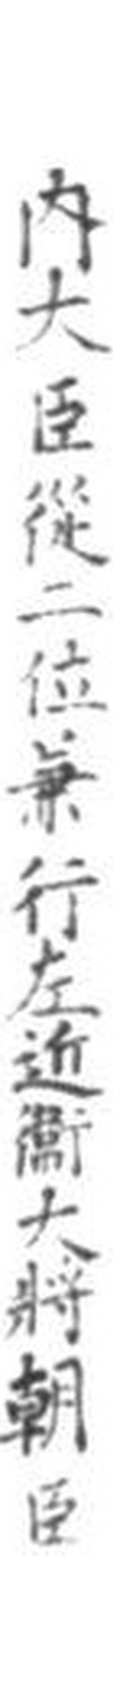内大臣従二位兼行左近衛大将朝臣
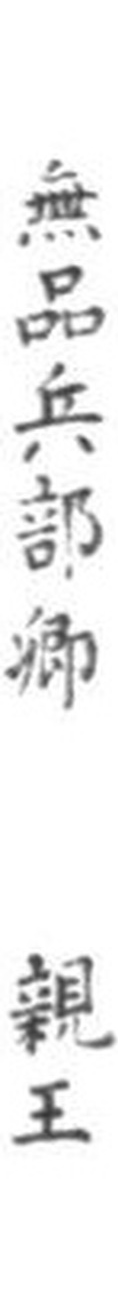無品兵部卿親王
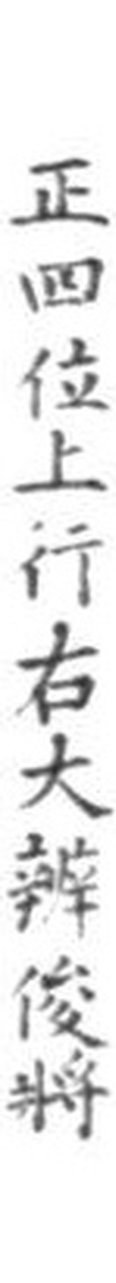正四位上行右大辯俊将
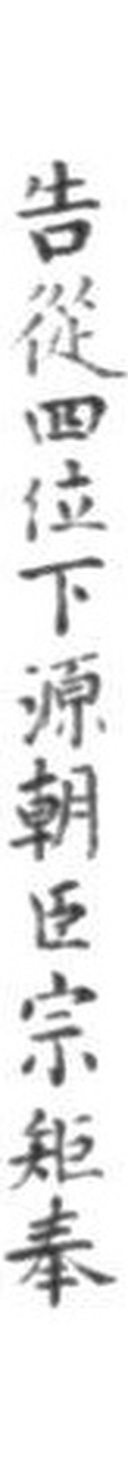告従四位下源朝臣宗矩奉
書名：家譜 四十 宗矩公 従享保十一年到享保十二年
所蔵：福井県文書館 Fukui Prefectural Archives
